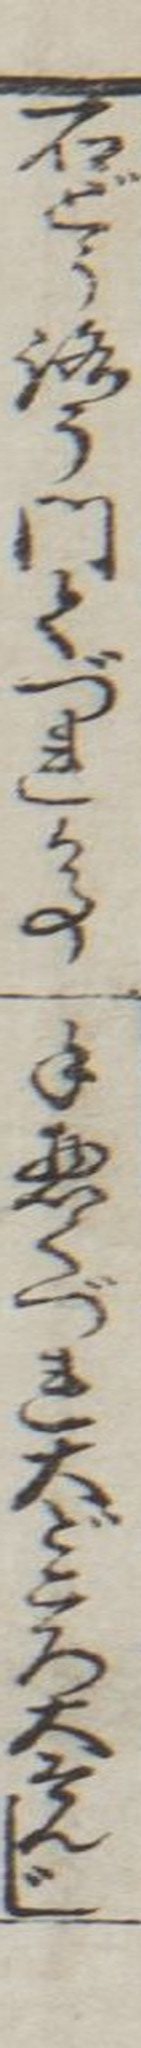石どうろう門くづれ候事
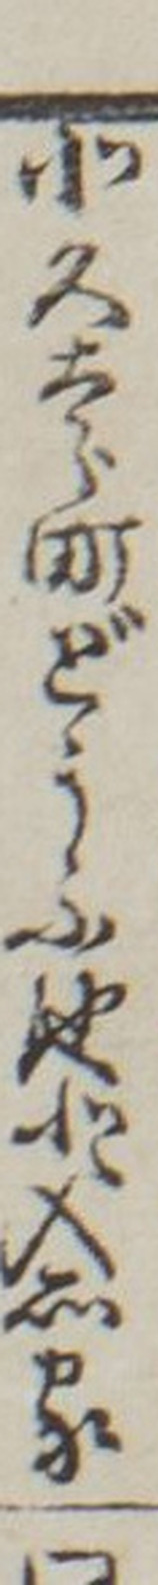北久太郎町どうふや北へ入所家
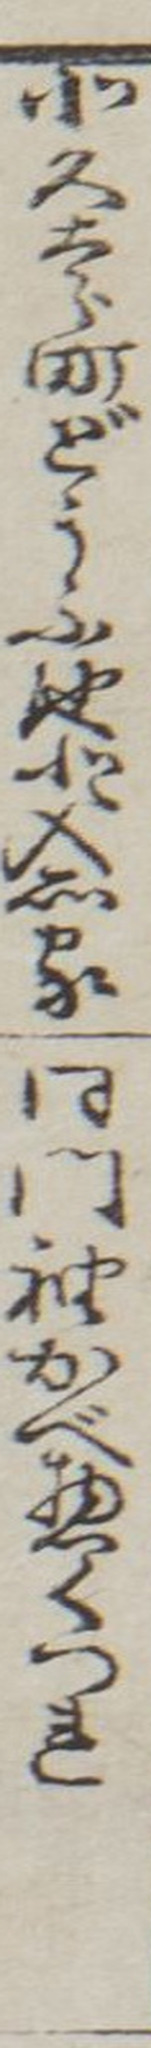北久太郎町どうふや北へ入所家
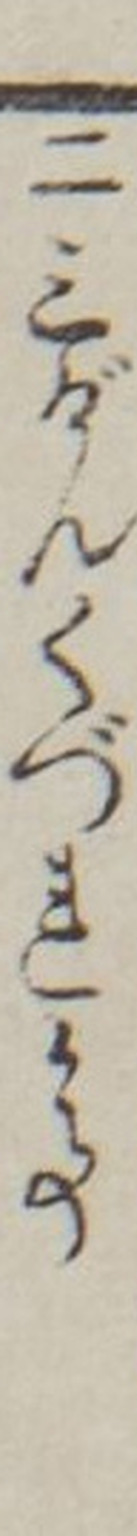二三げんくづれ候事
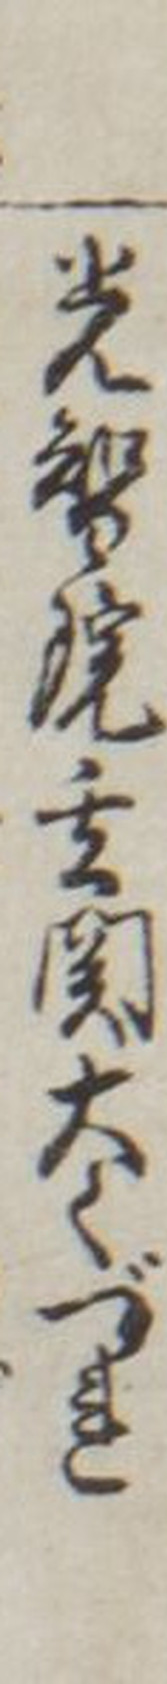光智院玄関大くづれ
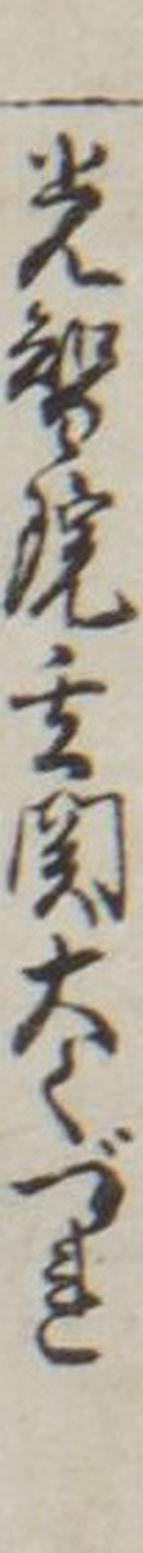光智院玄関大くづれ
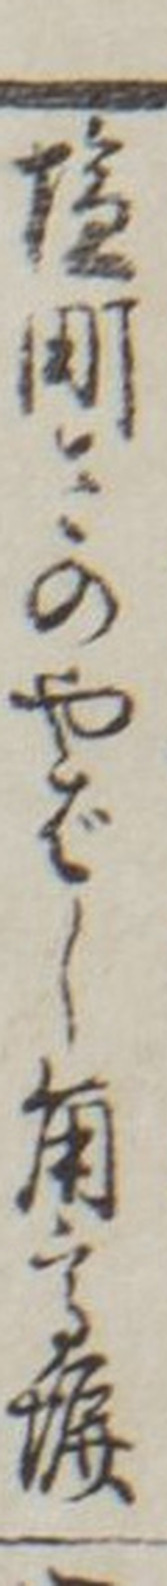塩町さのやばし角高塀
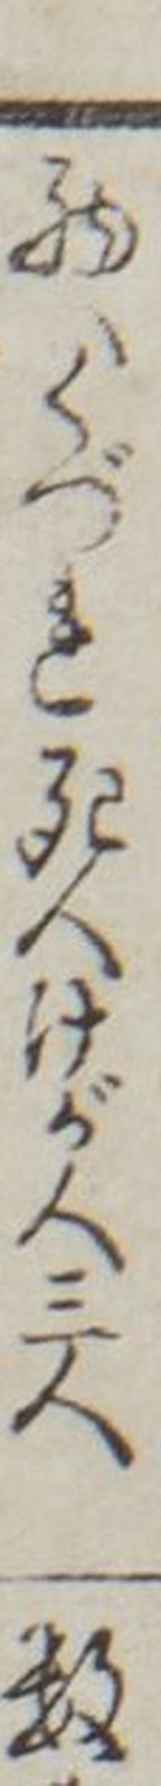西へくづれ死人けが人三人
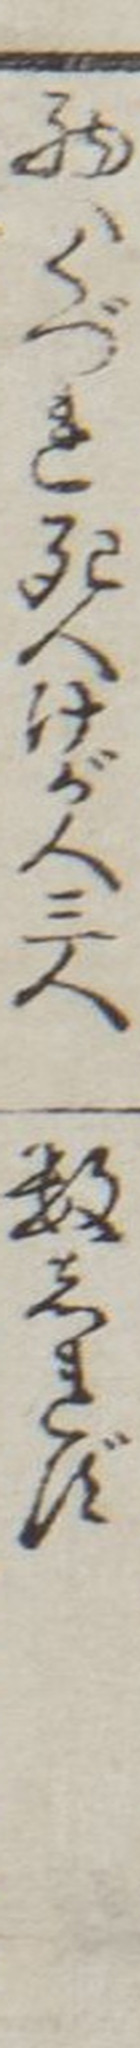西へくづれ死人けが人三人
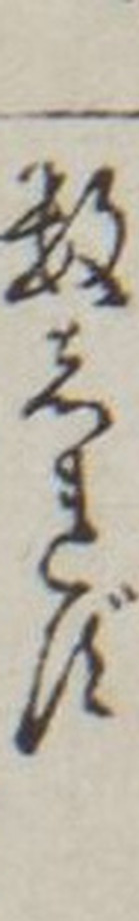数しれず
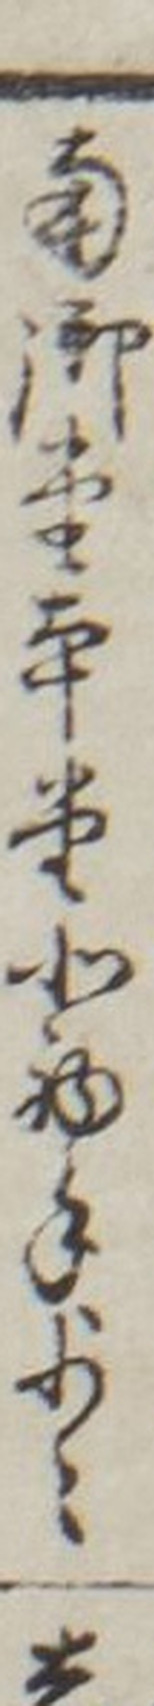南御堂本堂北西手少々
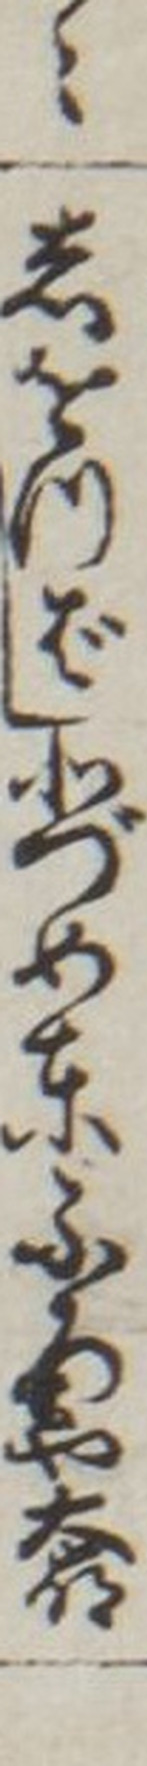しをつばし北づめ東ふろや大崩
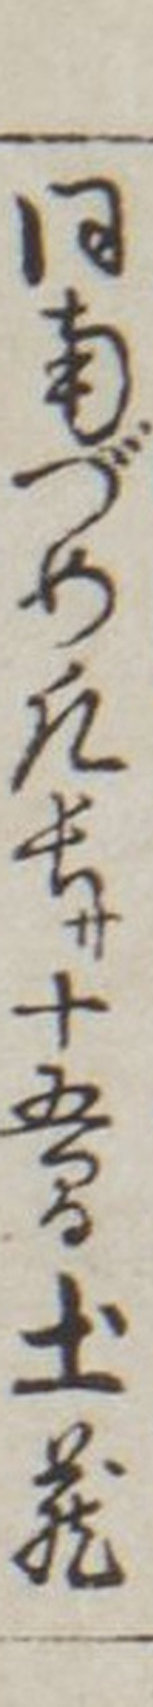同南づめ凡長さ十五間土蔵
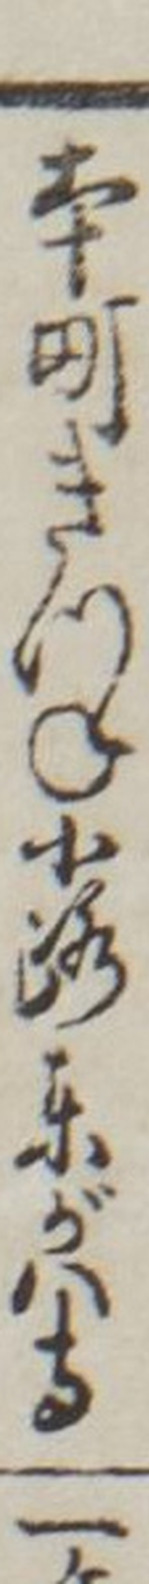本町きつね小路東がは寺
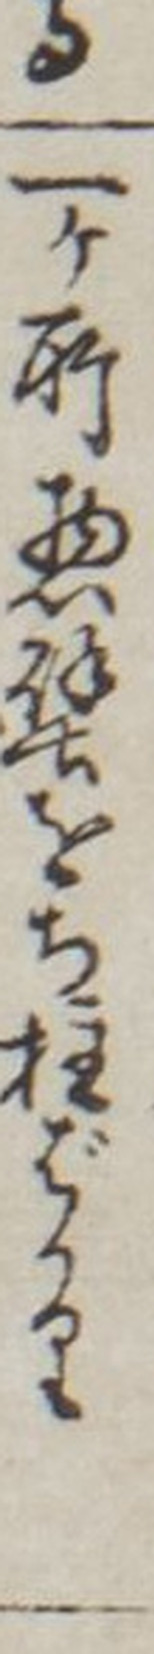一ヶ所惣壁をち柱ばかり
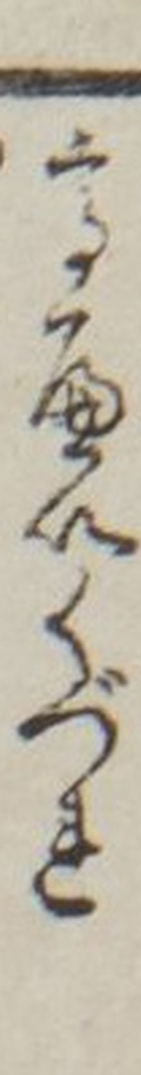高へいくづれ
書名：本しらべ大阪大地震の次第初編
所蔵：あいおいニッセイ同和損保株式会社
